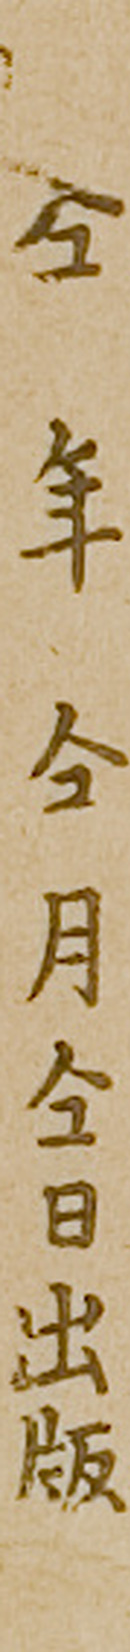仝年仝月仝日出版
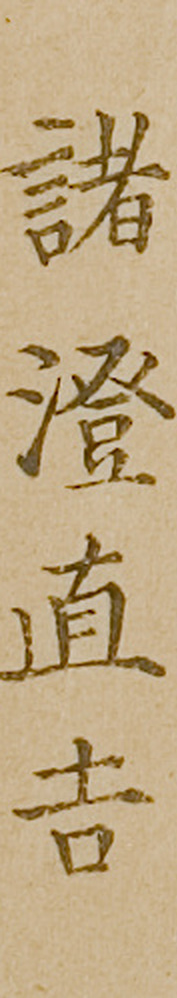諸澄直吉
